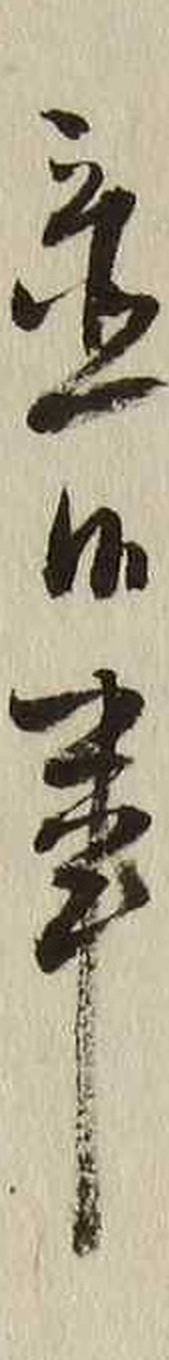置候事
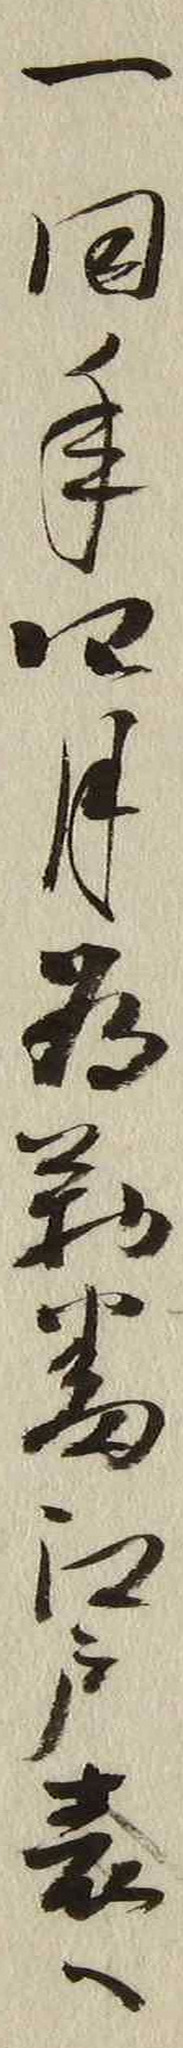一同年四月為勤番江戸表へ
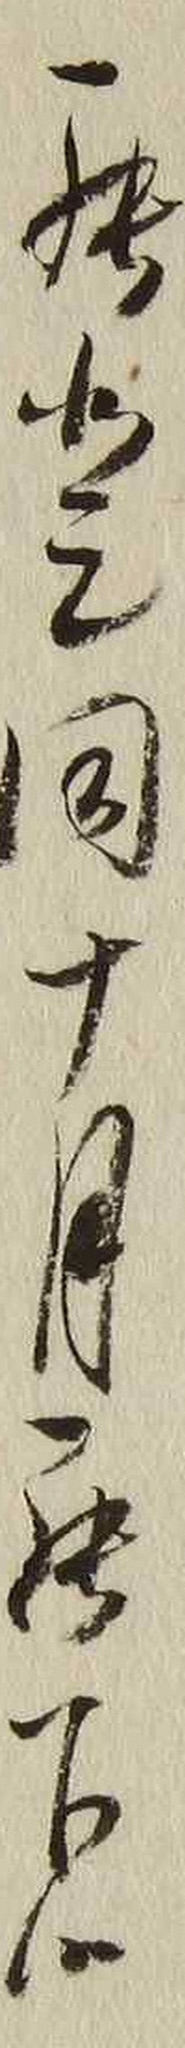罷登同十月罷下候
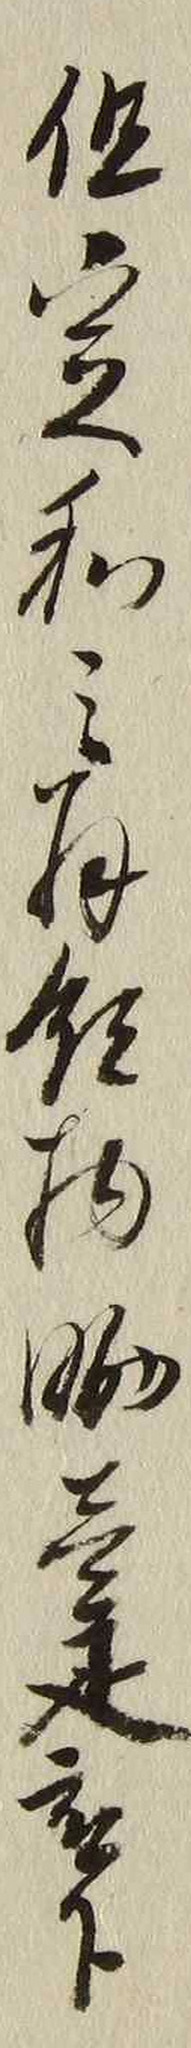但定和之拝領物晒壱疋被下
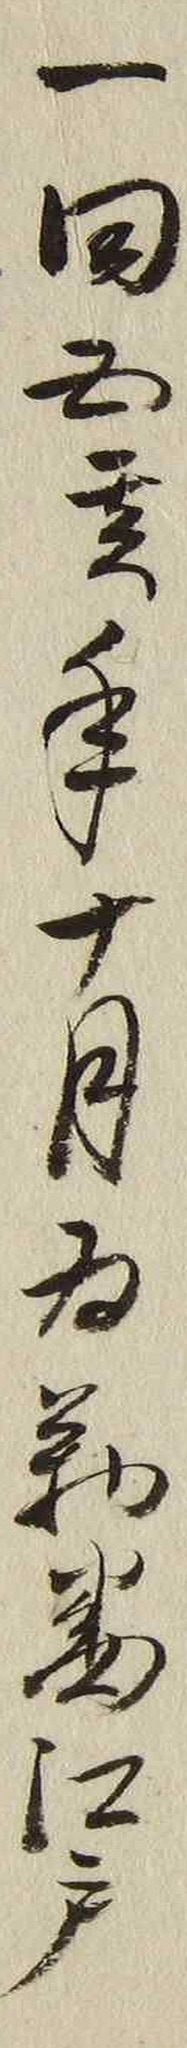一同五亥年十月為勤番江戸
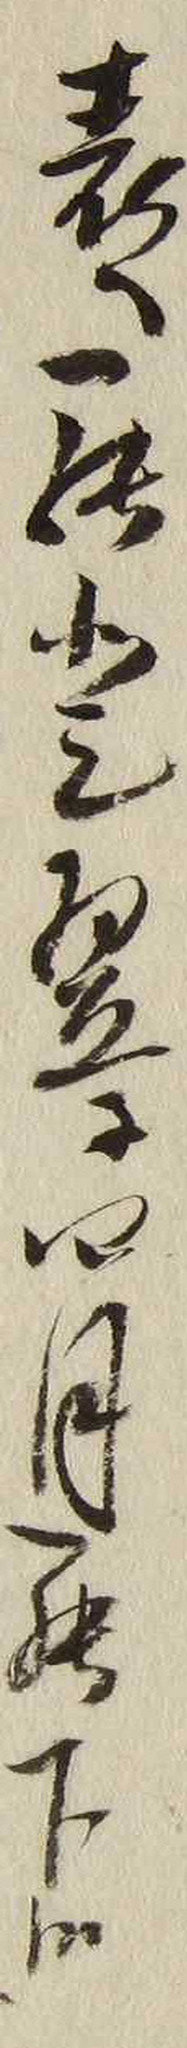表へ罷登翌子四月罷下候
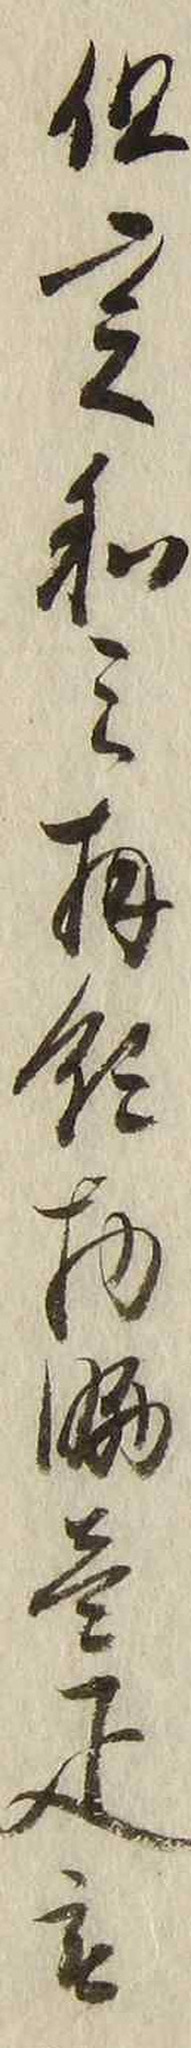但定和之拝領物晒壱疋被下

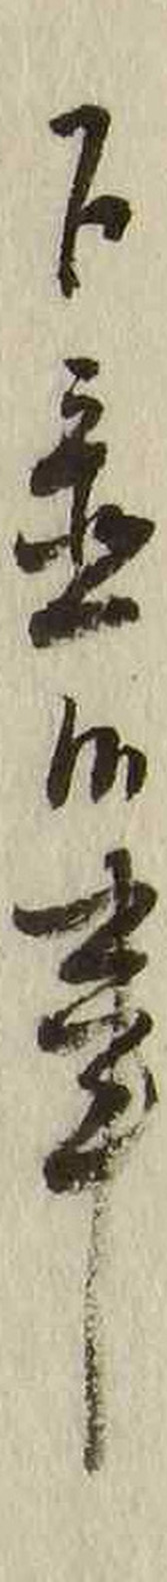下置候事
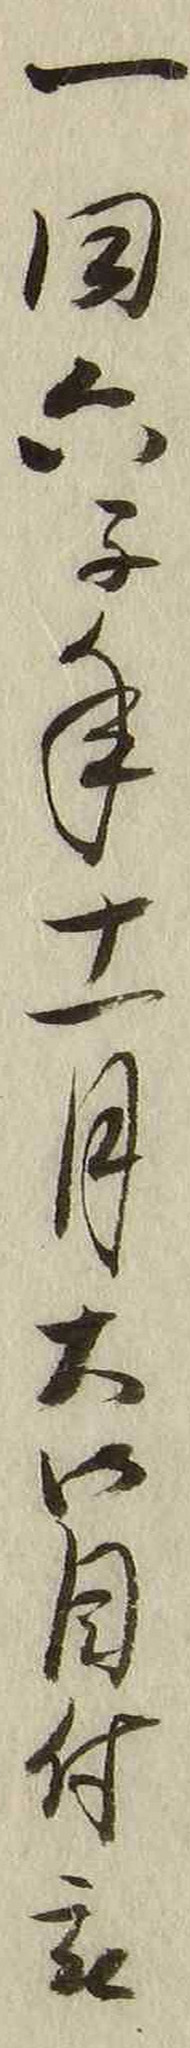一同六子年十一月大御目付被
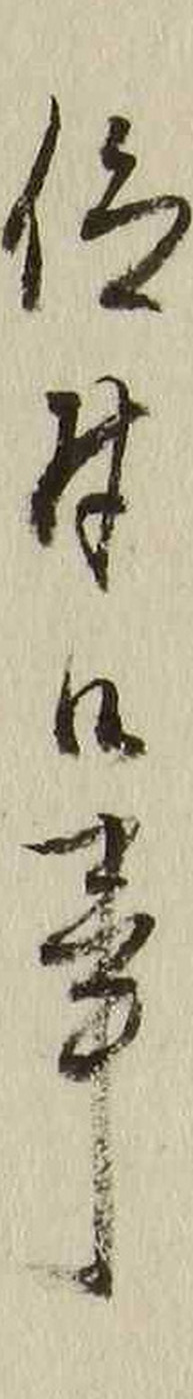仰付候事
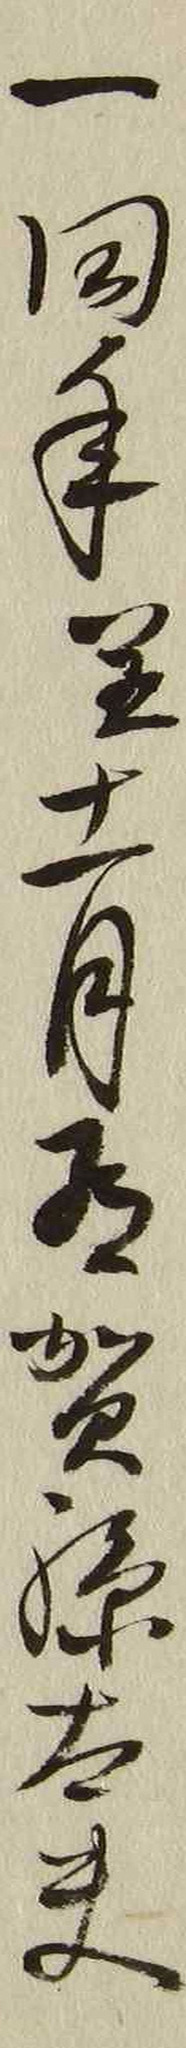一同年閏十一月有賀孫太夫
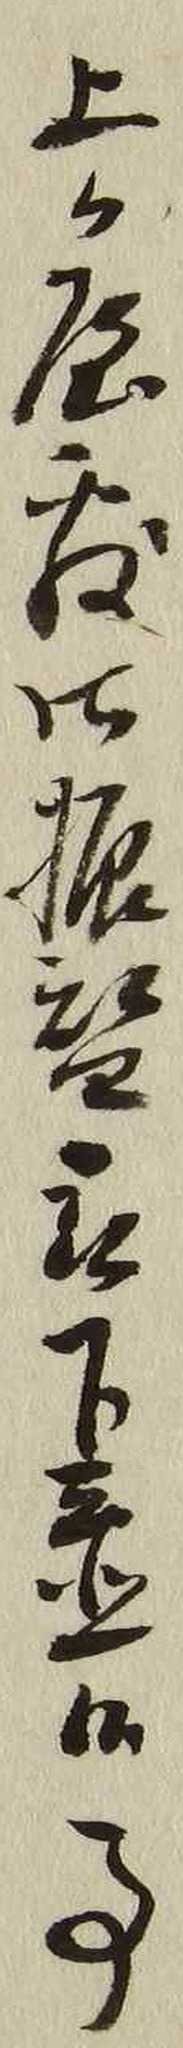上ケ屋敷御振替被下置候事
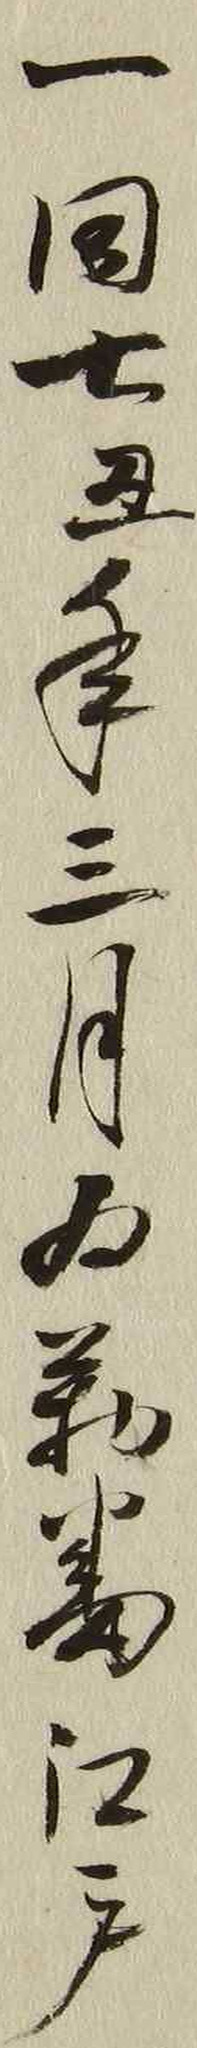一同七丑年三月為勤番江戸
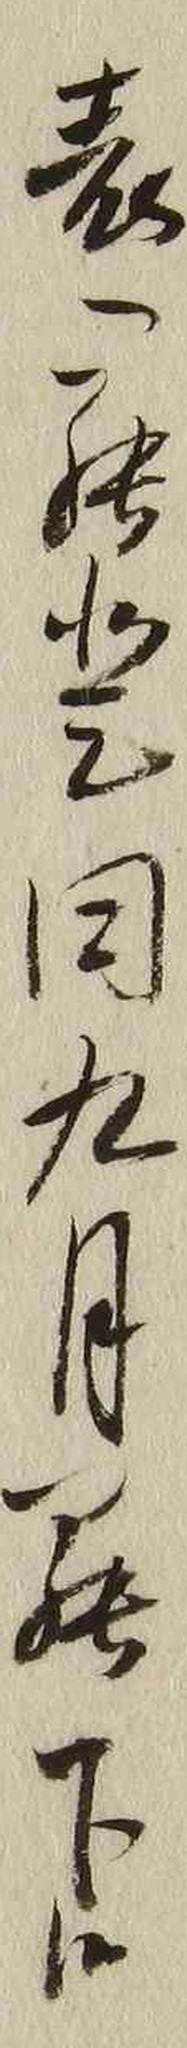表へ罷登同九月罷下候
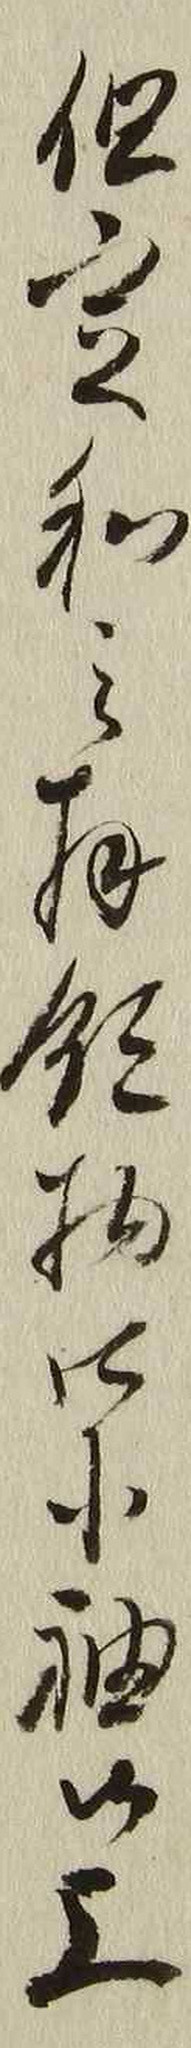但定和之拝領物御小袖御上
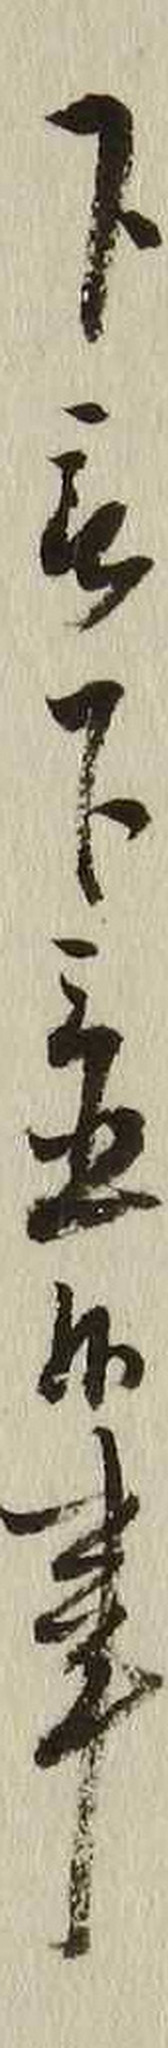下被下置候事
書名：諸士系譜　巻之355　す之部5
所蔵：会津若松市立会津図書館
